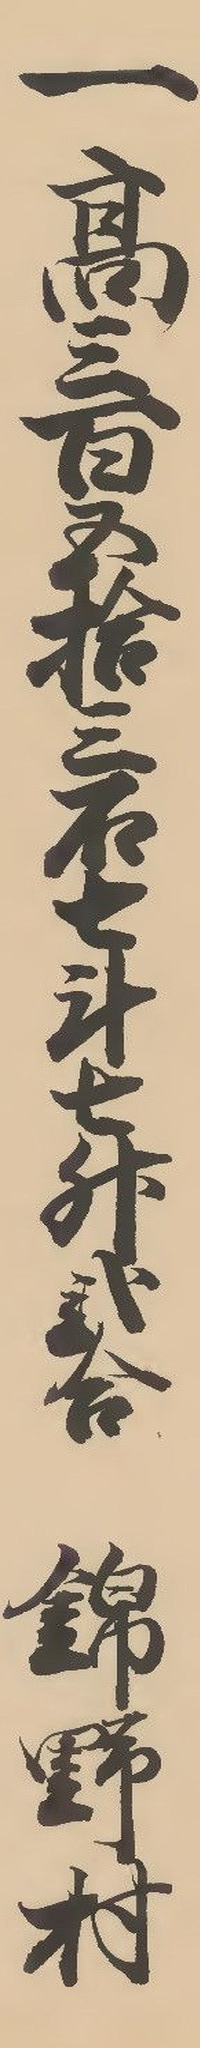一髙三百五拾三石七斗七升弐合錦野村
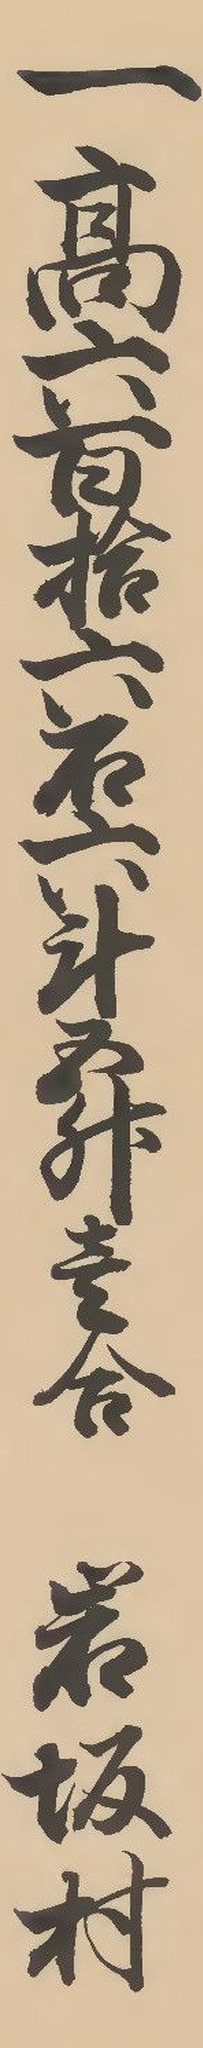一髙六百拾六石六斗五升壱合岩坂村
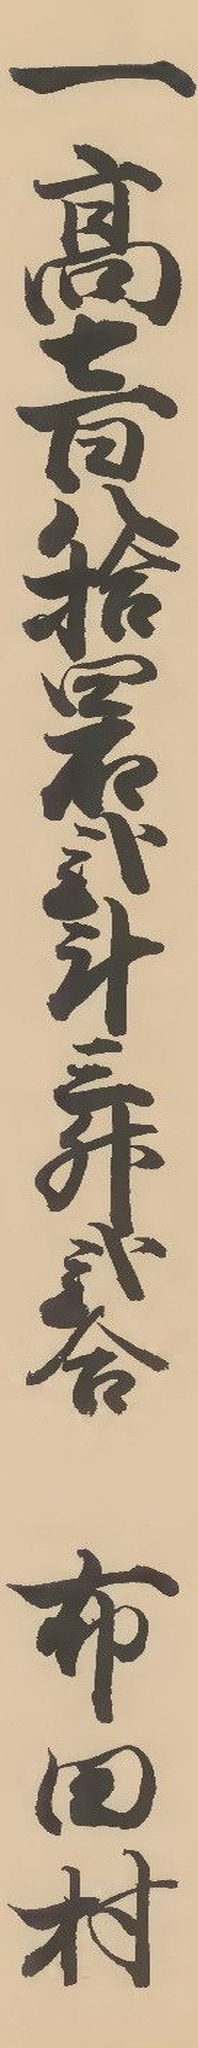一髙七百八拾四石弐斗三升弐合布田村
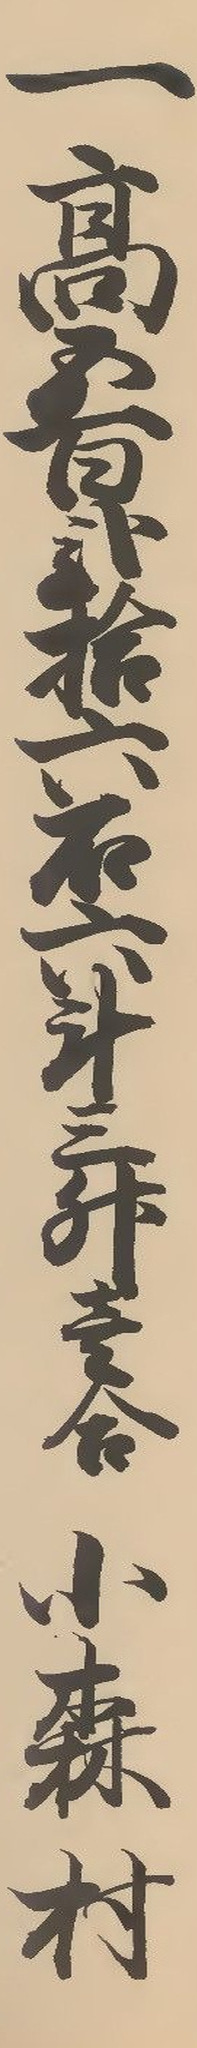一髙五百弐拾六石六斗三升壱合小森村
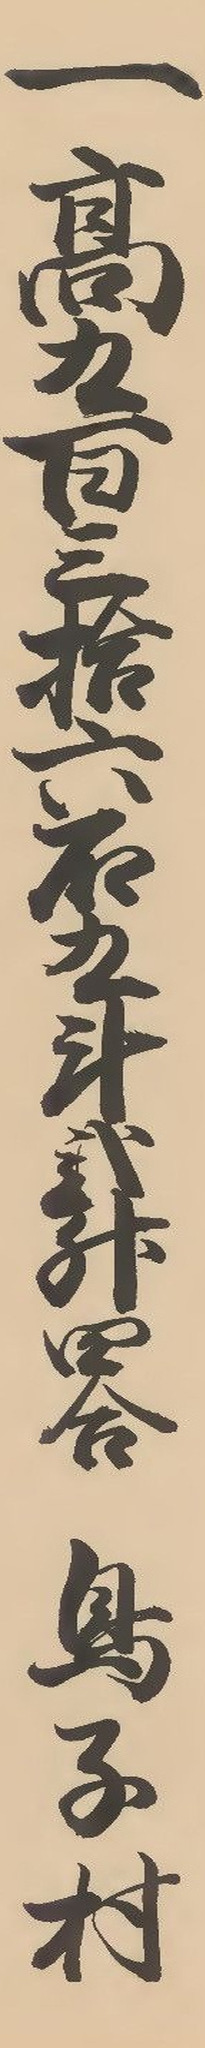一髙九百三拾六石九斗弐升四合鳥子村
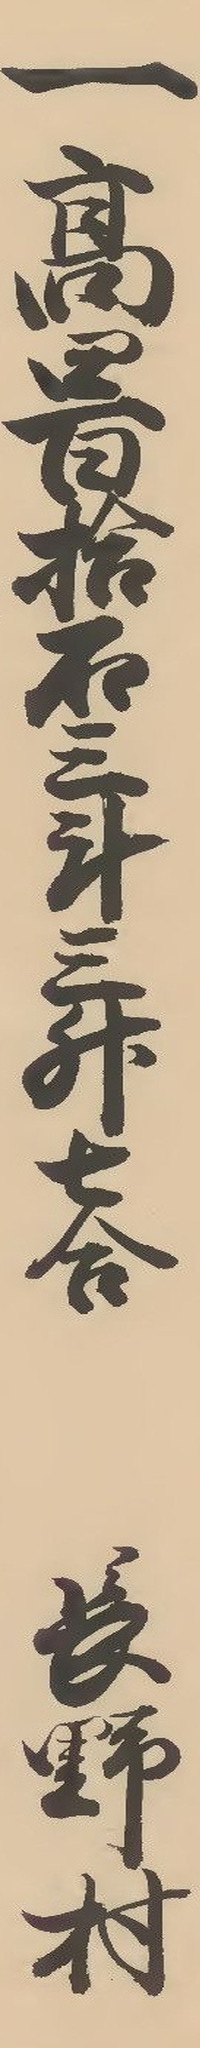一髙四百拾石三斗三升七合長野村
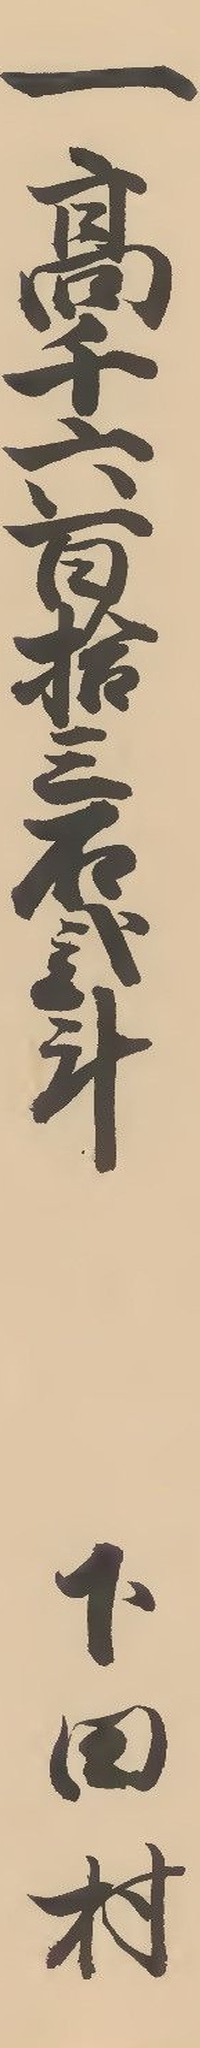一髙千六百拾三石弐斗下田村
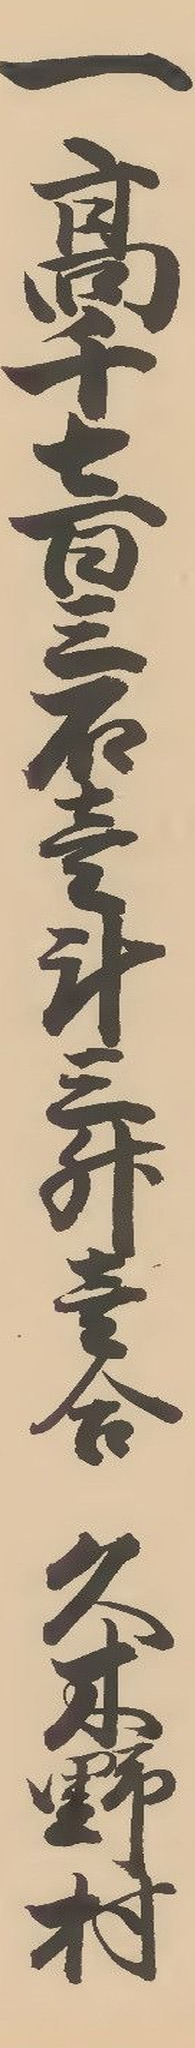一髙千七百三石壱斗三升壱合久木野村

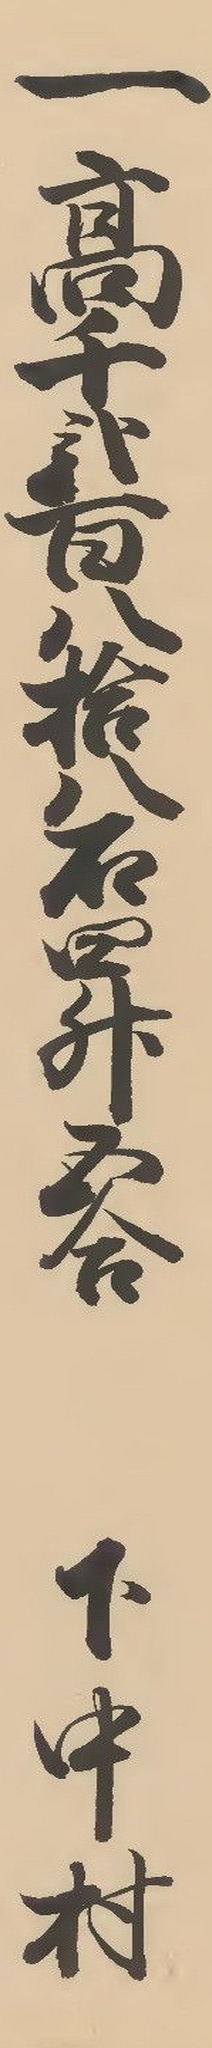一髙千弐百八拾八石四升五合下中村
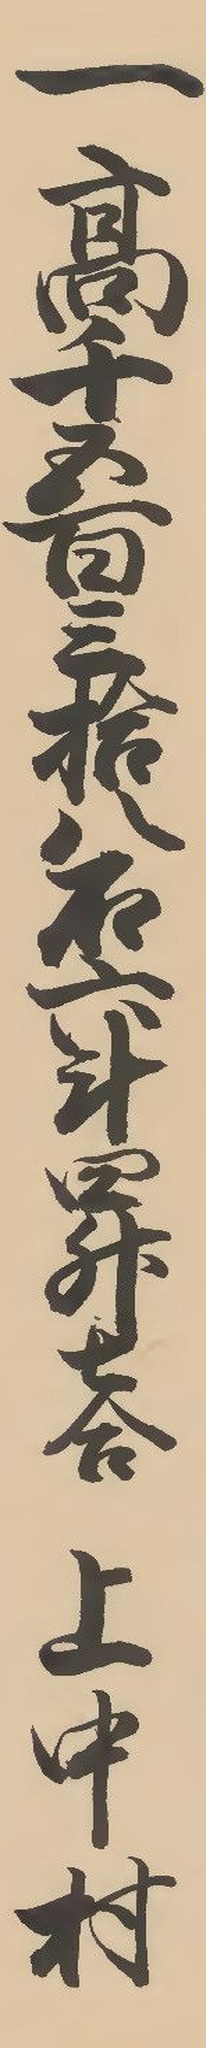一髙千五百三拾八石六斗四升七合上中村
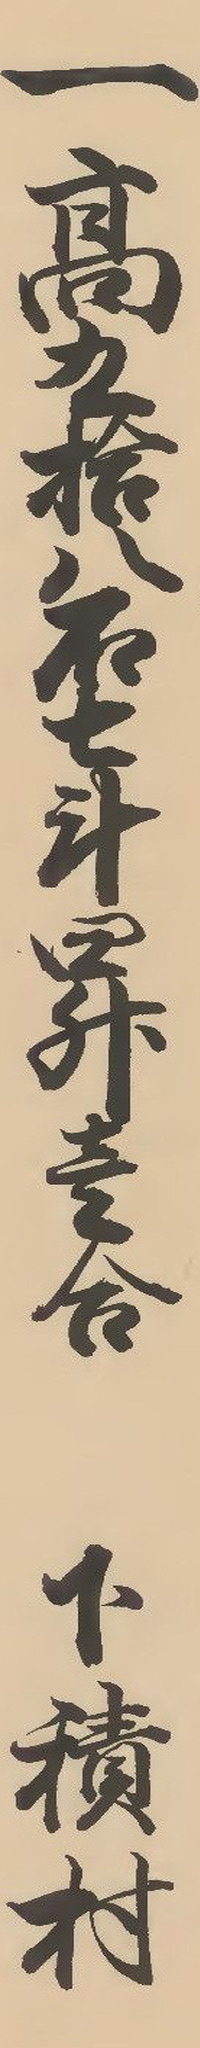一髙九拾八石七斗四升壱合下積村
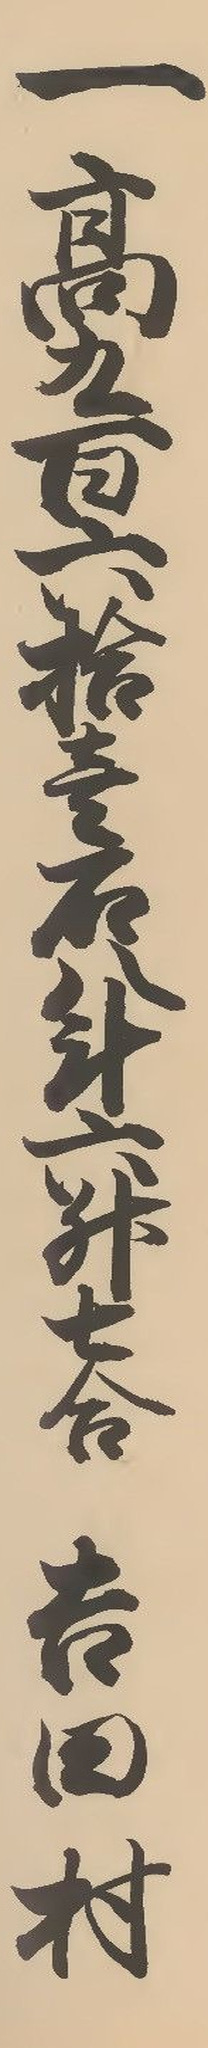一髙九百六拾壱石八斗六升七合吉田村
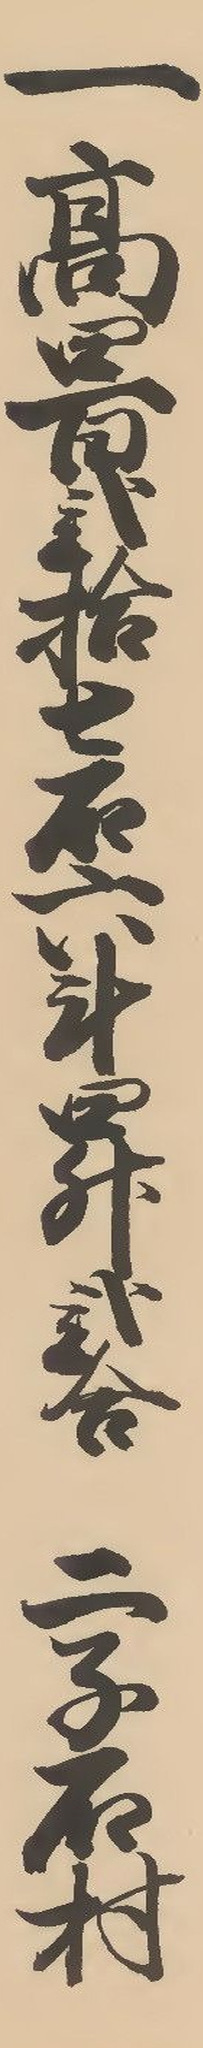一髙四百弐拾七石六斗四升弐合二子石村
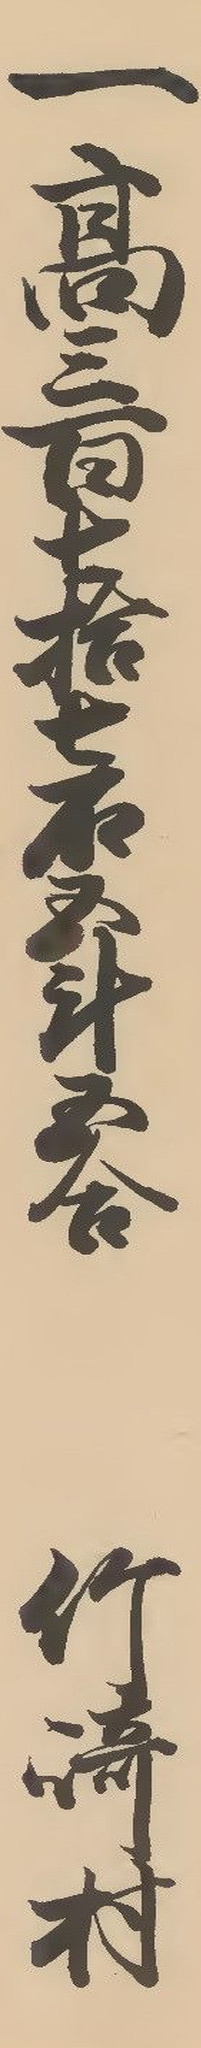一髙三百七拾七石五斗五合竹崎村
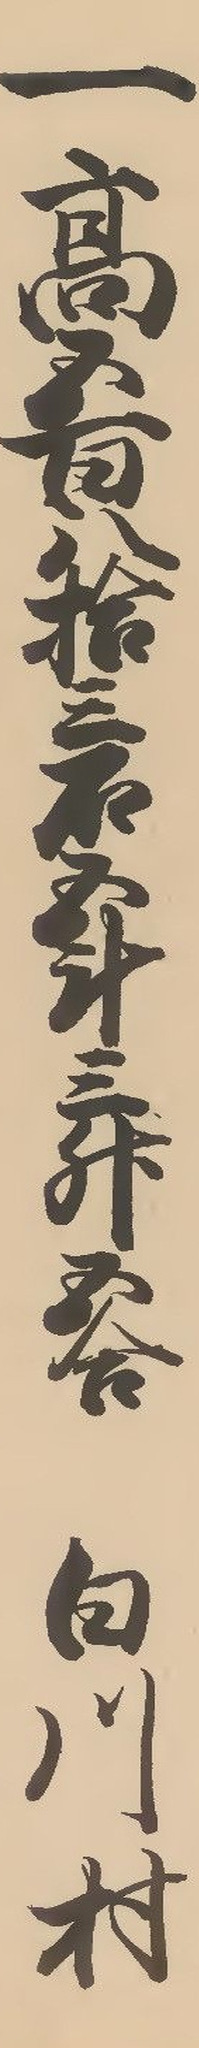一髙五百八拾三石五斗三升五合白川村
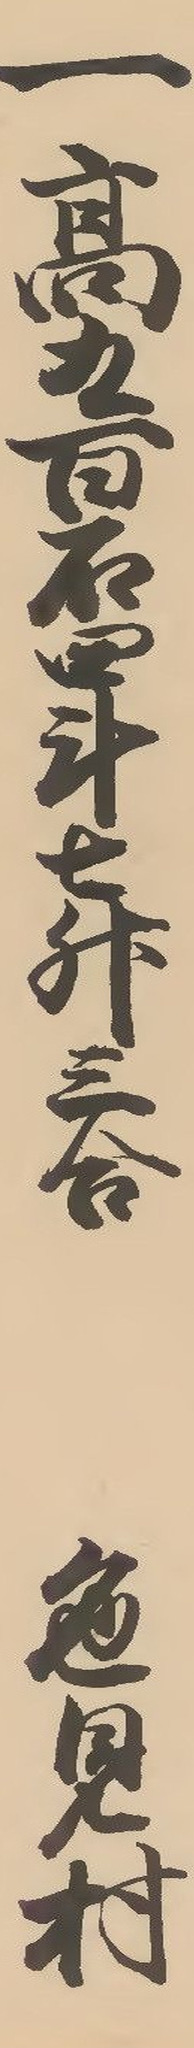一髙九百石四斗七升三合色見村
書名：肥後国郷帳
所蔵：国立公文書館 National Archives of Japan
